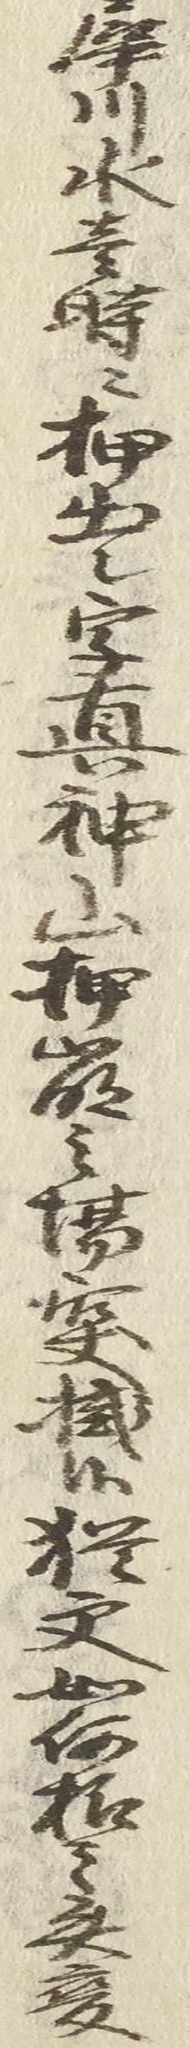犀川水壱時二押出し字真神山押崩之場突掛候猶又如何様之失変
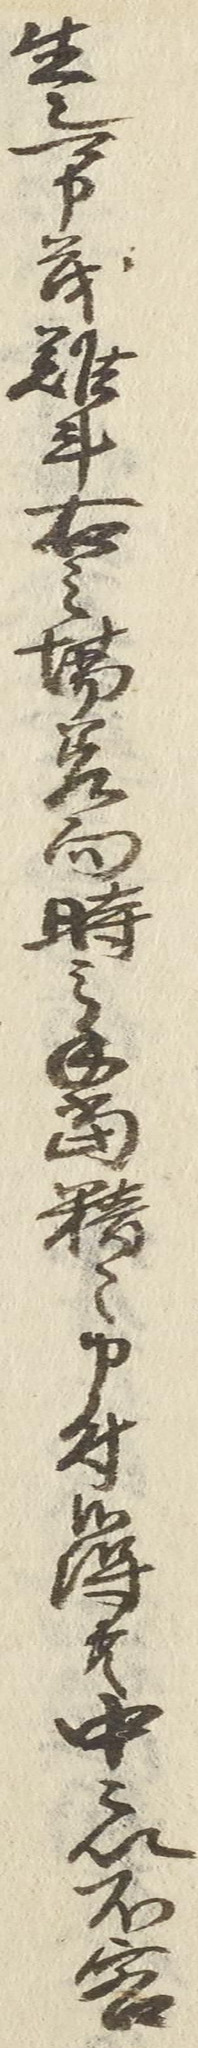生し可申も難斗右之場差向時之手当精々申付候得共中々以不容
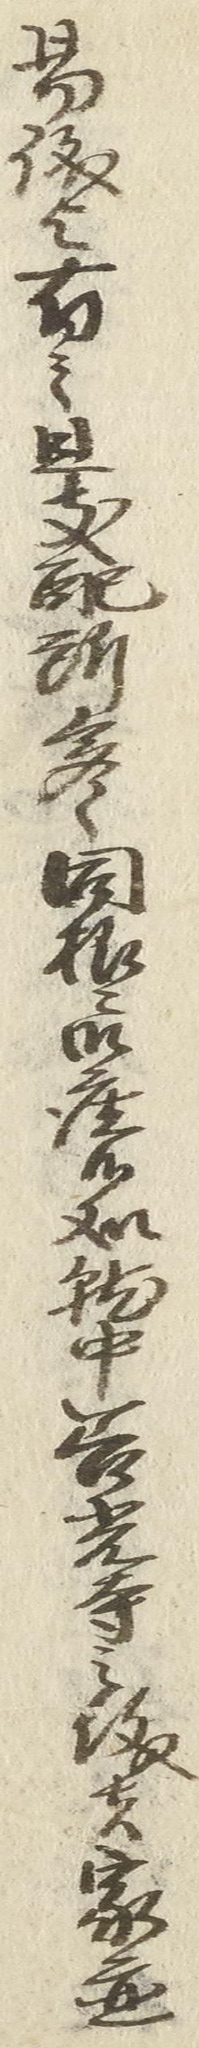易儀と有之且支配所多く同様二御座候処就中善光寺之儀は家並
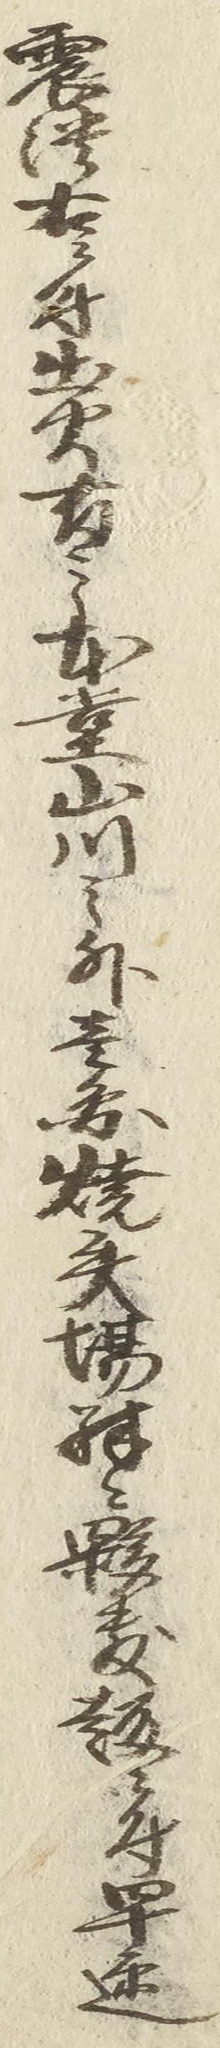震潰右二付出火有之本堂山川之外壱円焼失場殊二夥敷趣二付早速
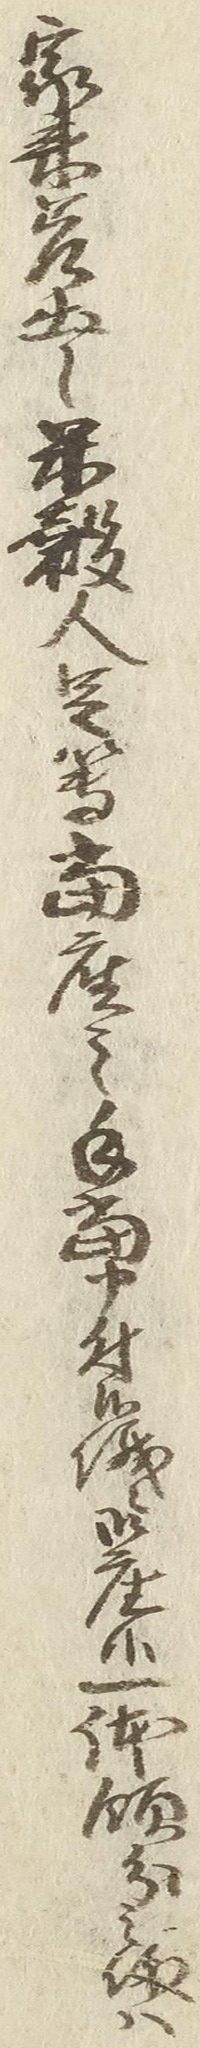家来差出し米穀人足等当座之手当申付候儀二御座候一体領分之儀は
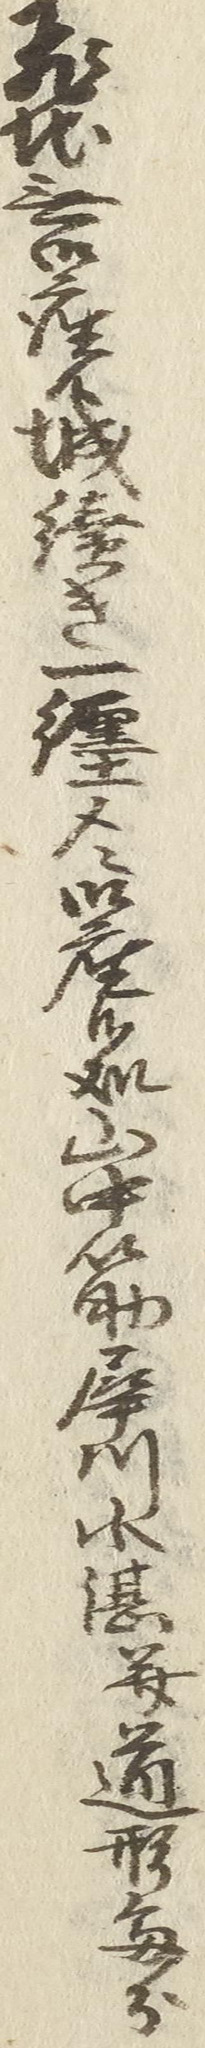飛地無御座候城続き一纏メ二御座候処山中筋犀川水湛并道形多分
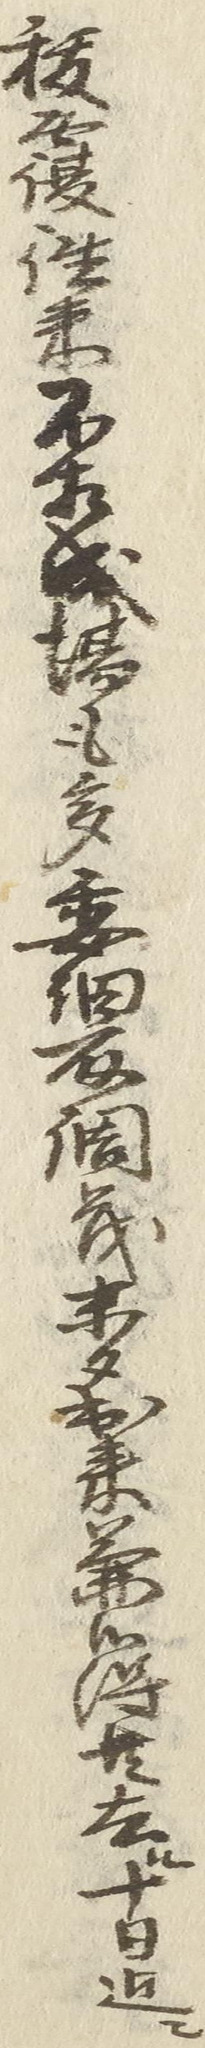抜覆往来不相成場も多委細取調も未タ出来兼候得共去ㇽ十日迄二
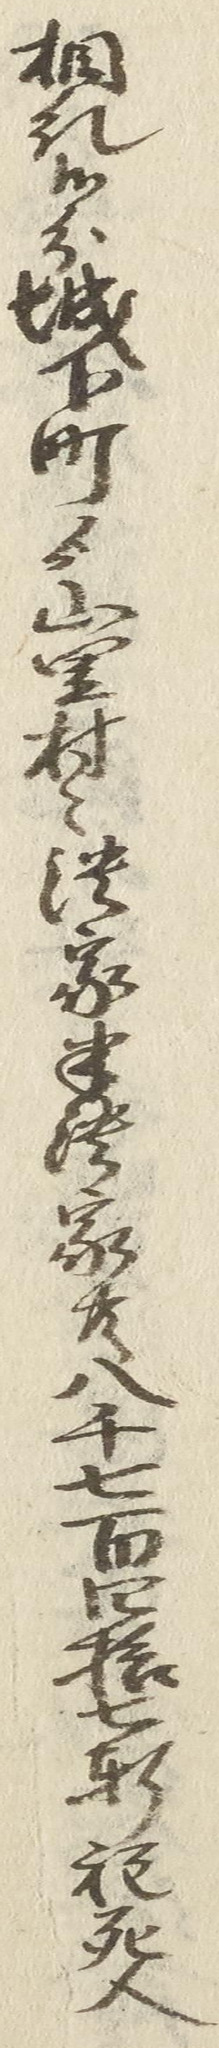相糺候分城下町ゟ山里村々潰家半潰家共八千七百四十七軒ノ程死人
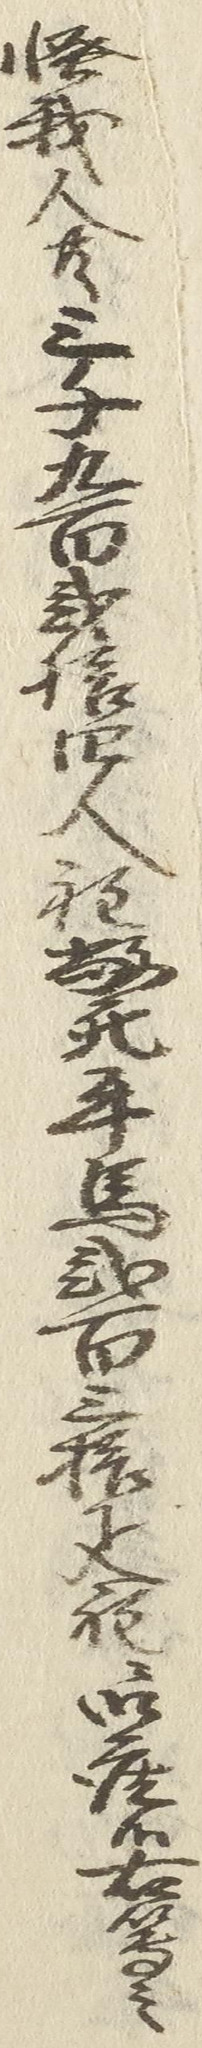怪我人共三千九百弐拾四人程斃死牛馬弐百三拾疋程二御座候右等之
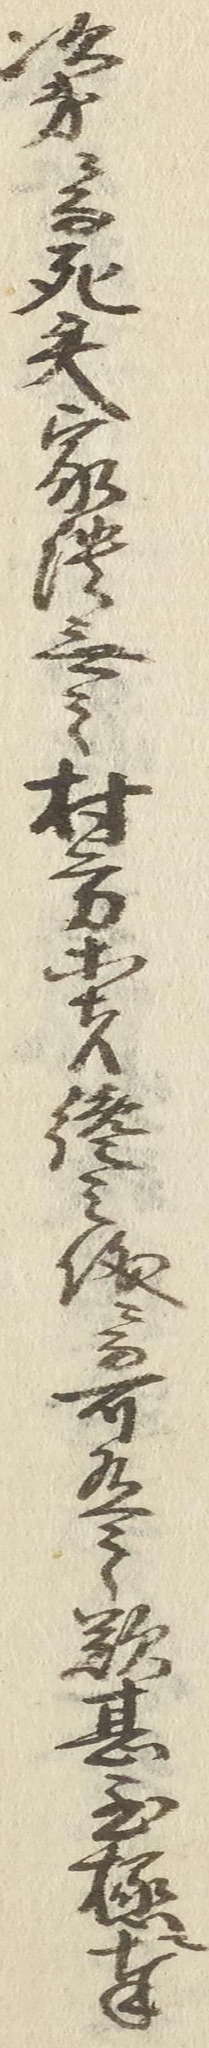次第二而死失家潰無之村方等は纔之儀二而可有之歎甚至極二奉
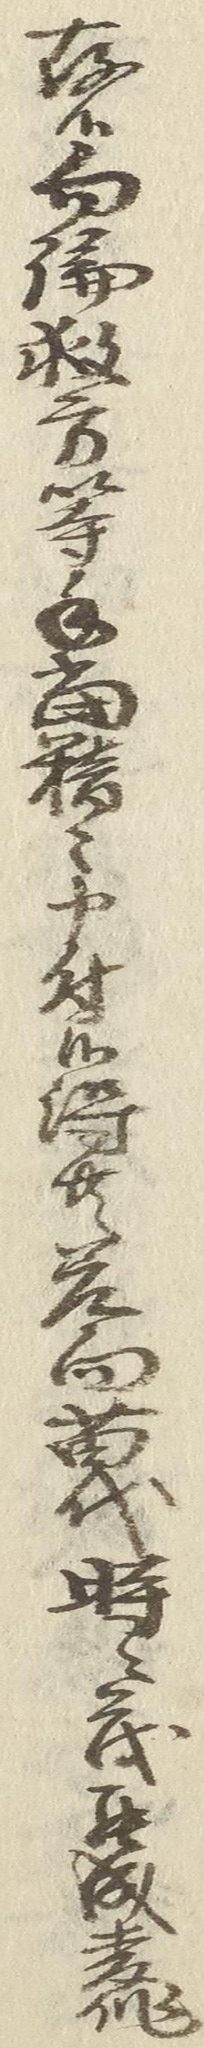存候勿論救方等手当精々申付候得共差向苗代時二罷成麦作

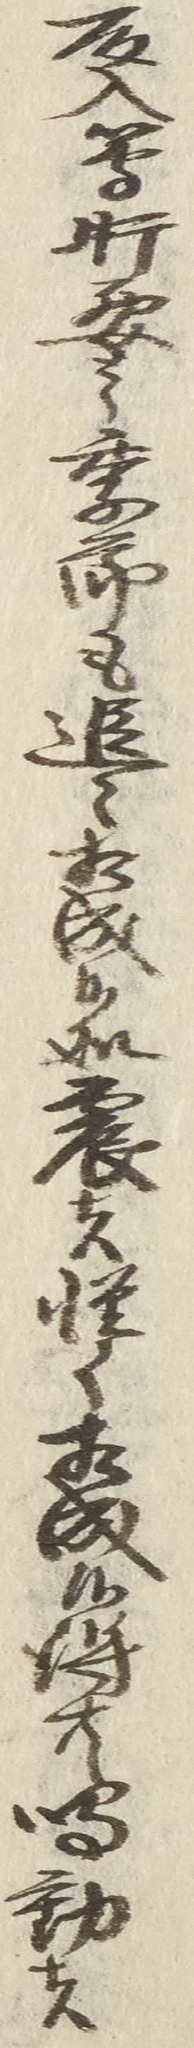取入等肝要之季節も追々相成候処震は軽く相成候得共鳴動は
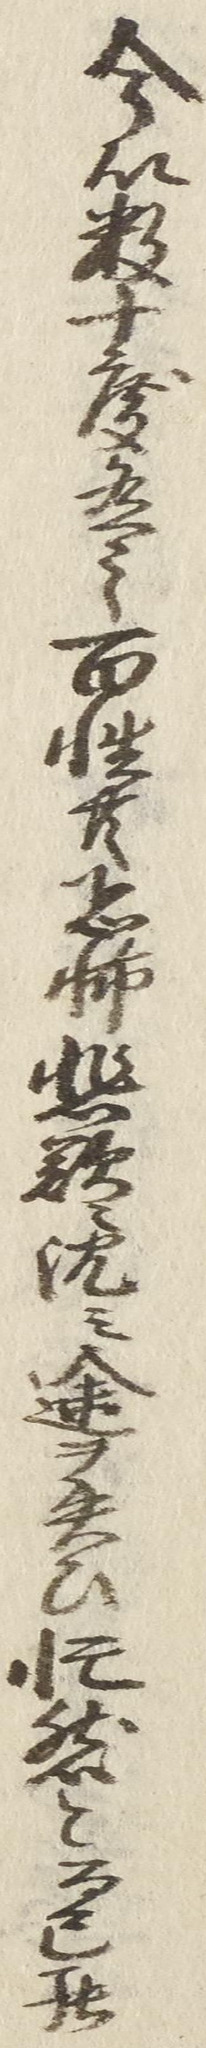今以数十度有之百姓共恐怖悲歎二沈ミ途を失ひ茫然と而巳居
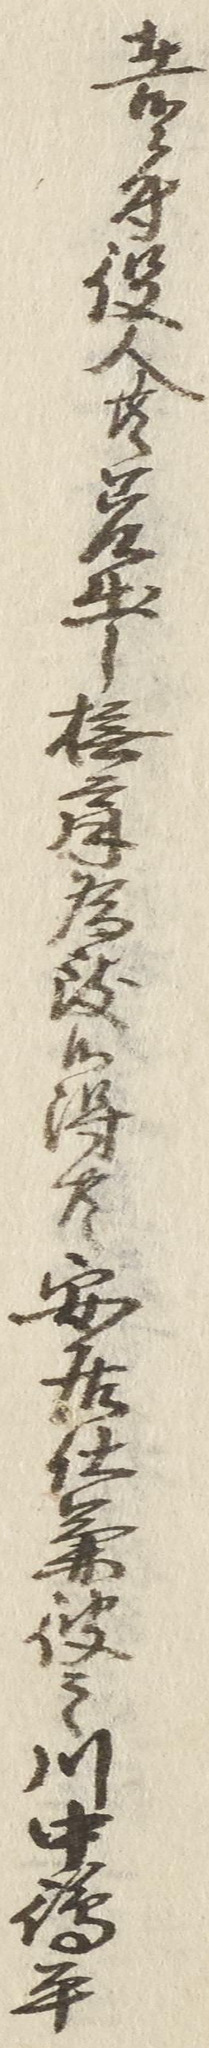在候二付役人共差出接育為致候得共安居仕兼彼之川中嶋平
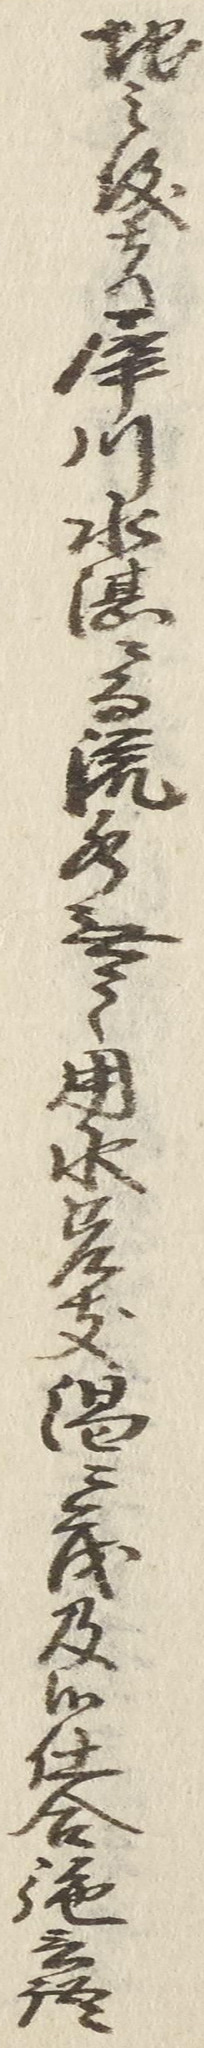地之儀は犀川水湛二而流水無之用水差支渇にも及候仕合絶言語
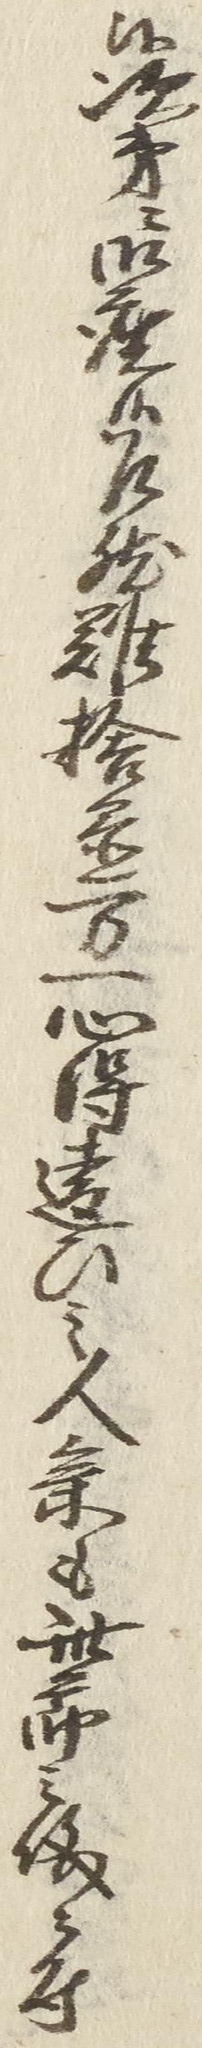候次第二御座候乍然難捨置万一心得違ひ之人気も此節之儀二付
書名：従往古地震御届書記誌之一
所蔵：東京大学地震研究所図書室 Earthquake Research Institute Library, The University of Tokyo, JAPAN
